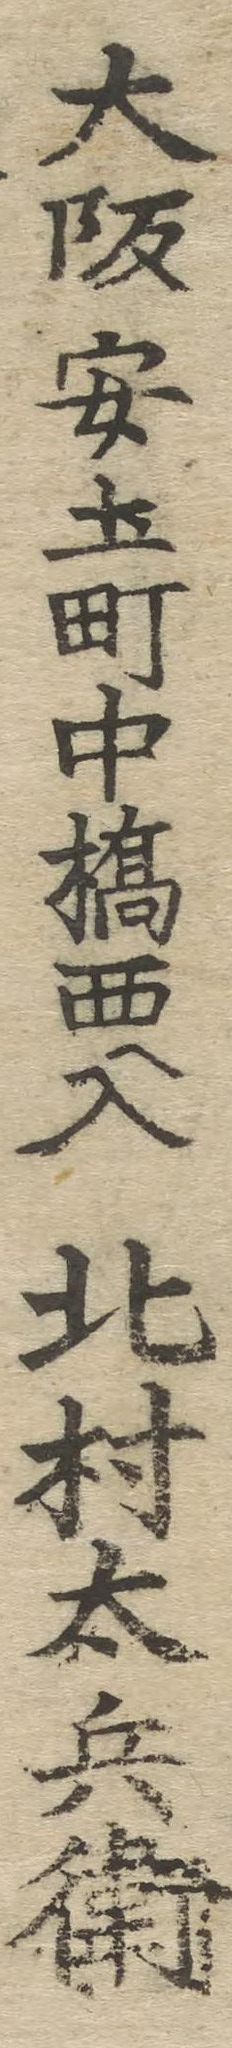大阪安土町中橋西へ入北村太兵衛
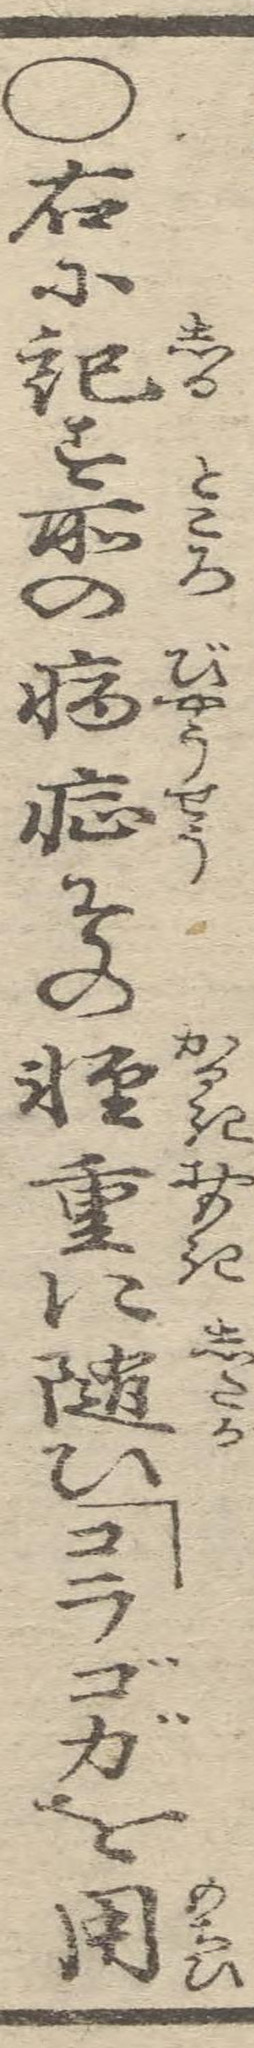○右に記す所の病症その軽重に随ひ「コラゴガを用
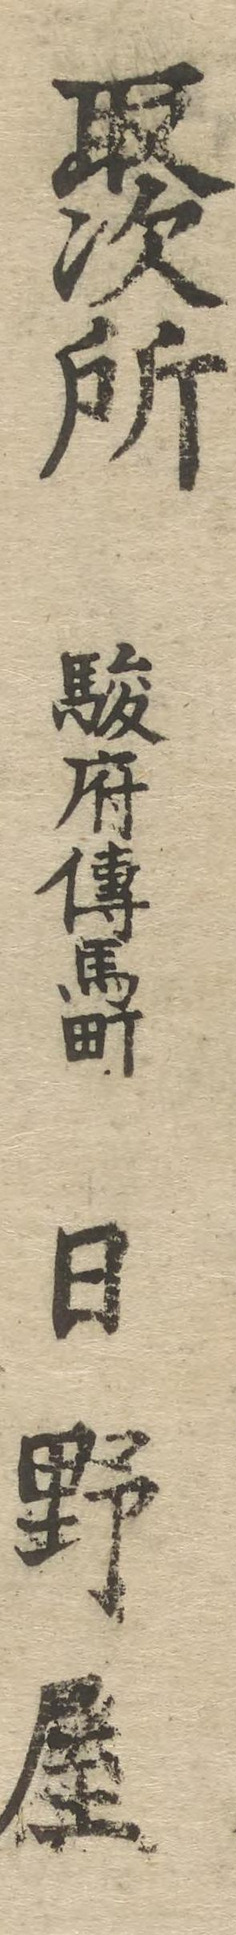取次所駿府伝馬町日野屋
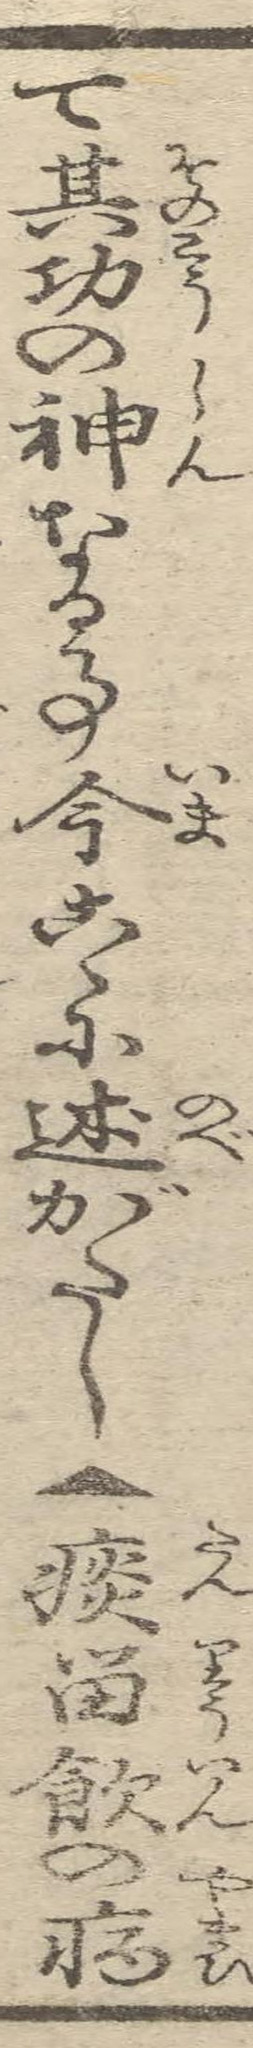て其功の神なる事今こゝに述がたし▲痰留飲の病
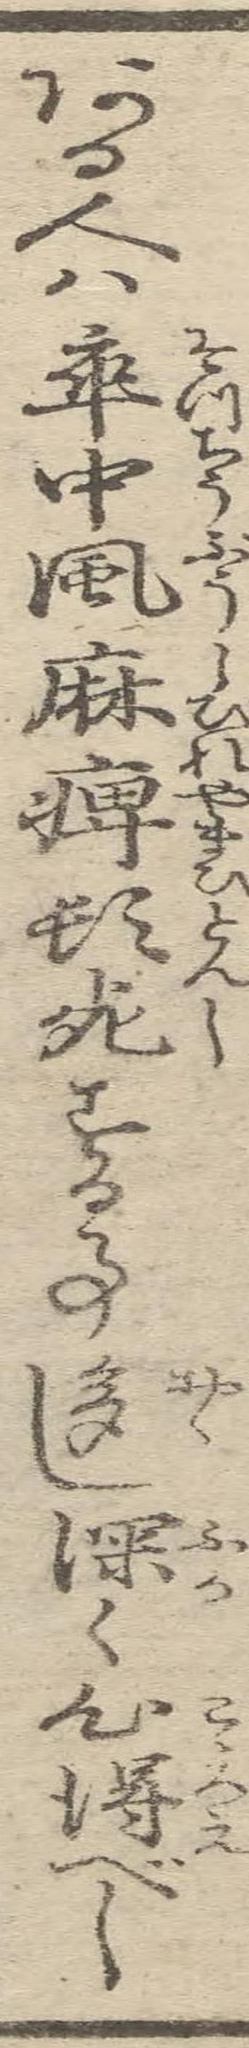ある人は卒中風麻痺頓死する事多し深く心得べし
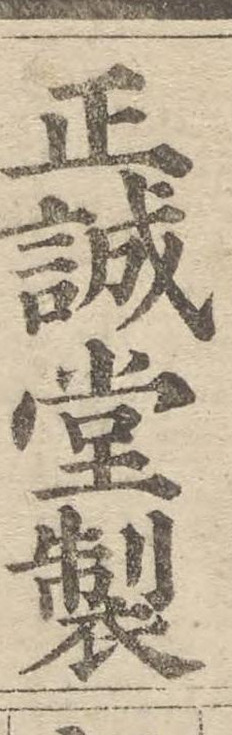正誠堂製
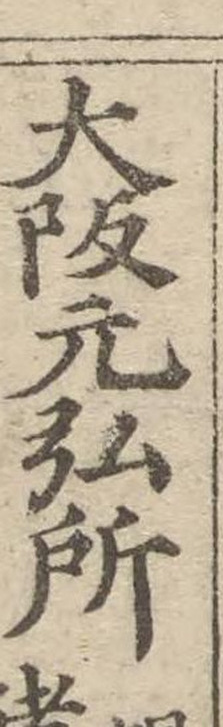大阪取次所
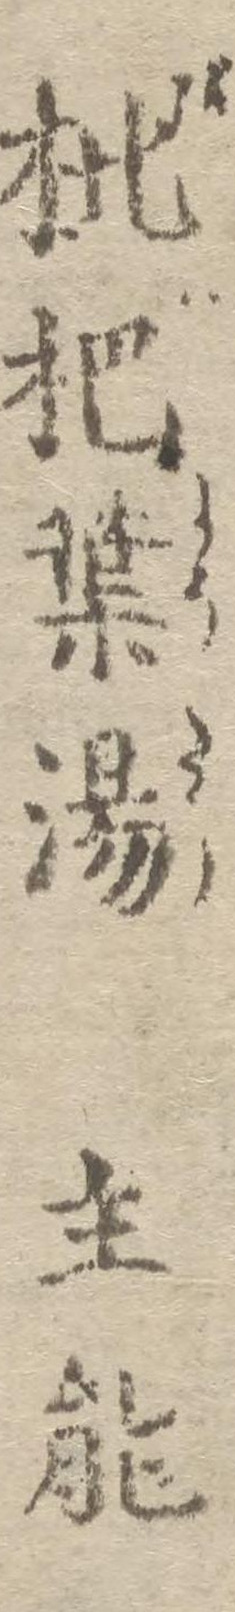枇杷葉湯主能
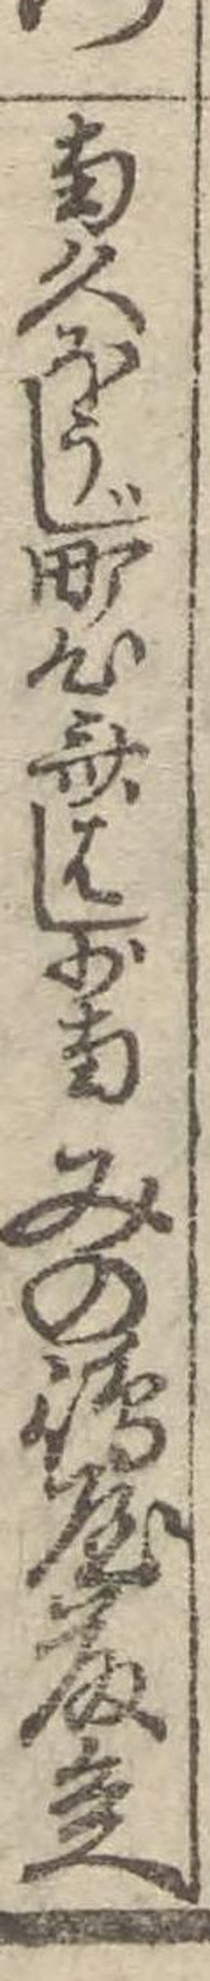南久ほうじ町心斎はし少南みの嶋屋藤兵へ
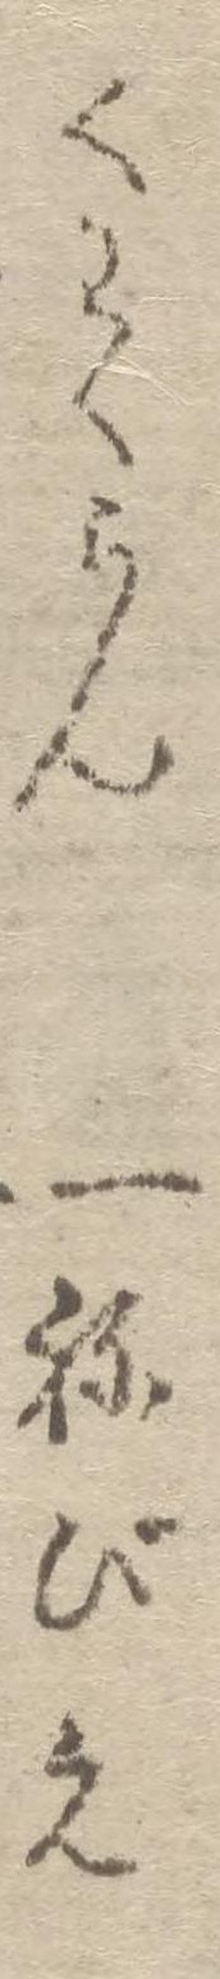一くわくらん一ねびえ
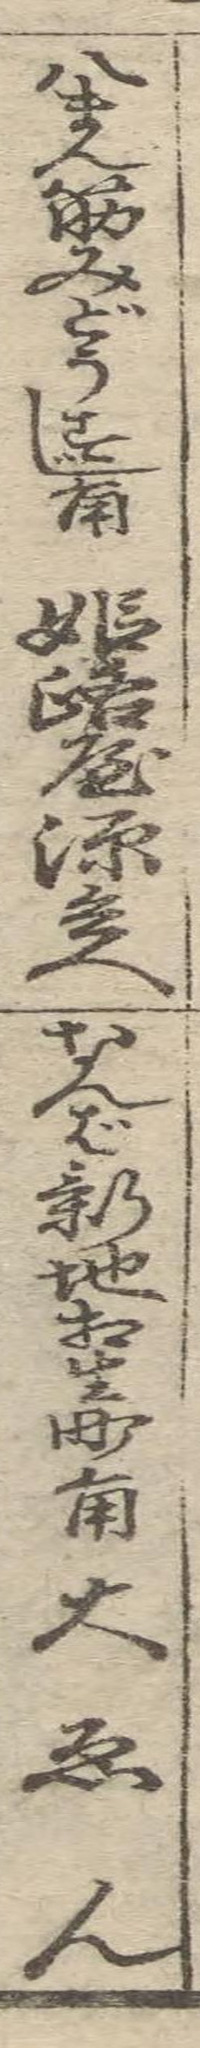八まん筋みどうすじ角姫路屋源兵へ
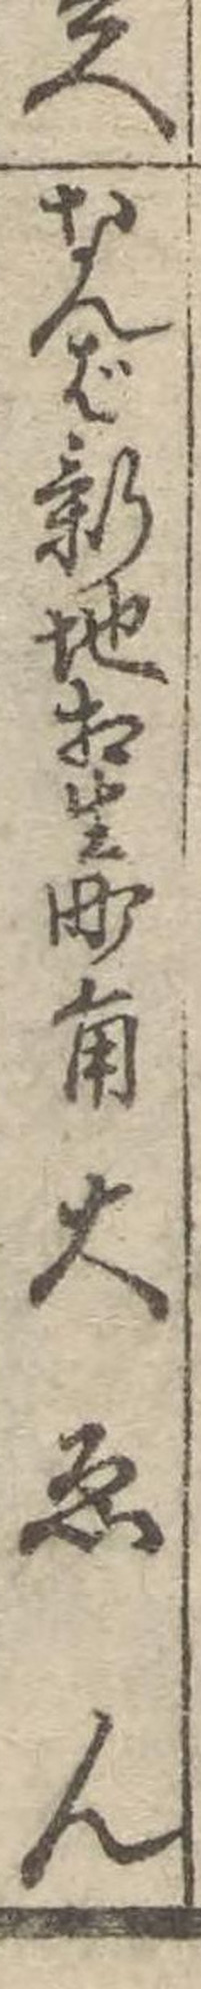なんば新地相生町角大ゑん
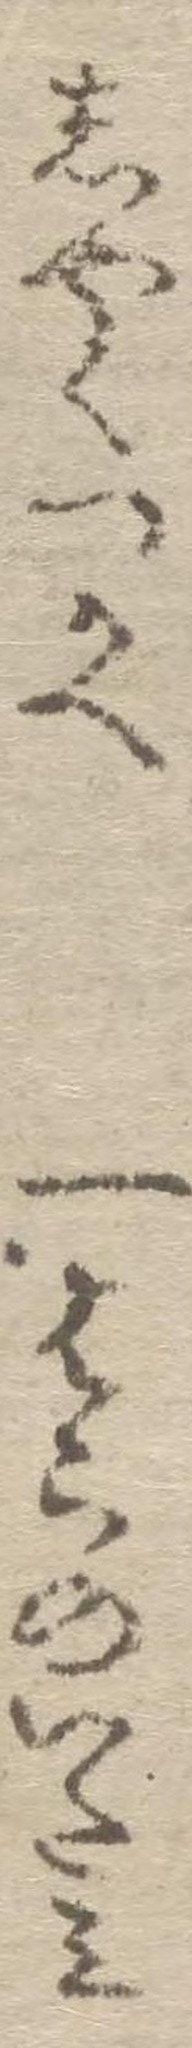一しやくつかへ一はらのいたみ
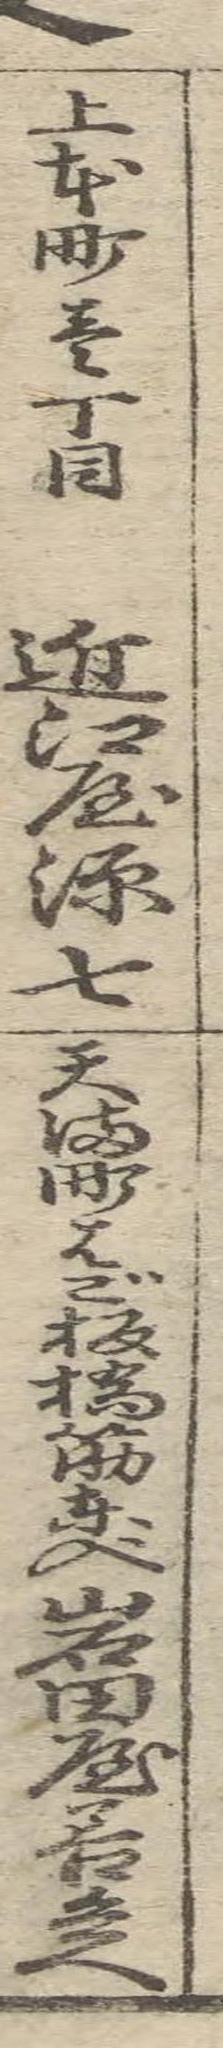上本町壱丁目近江屋源七
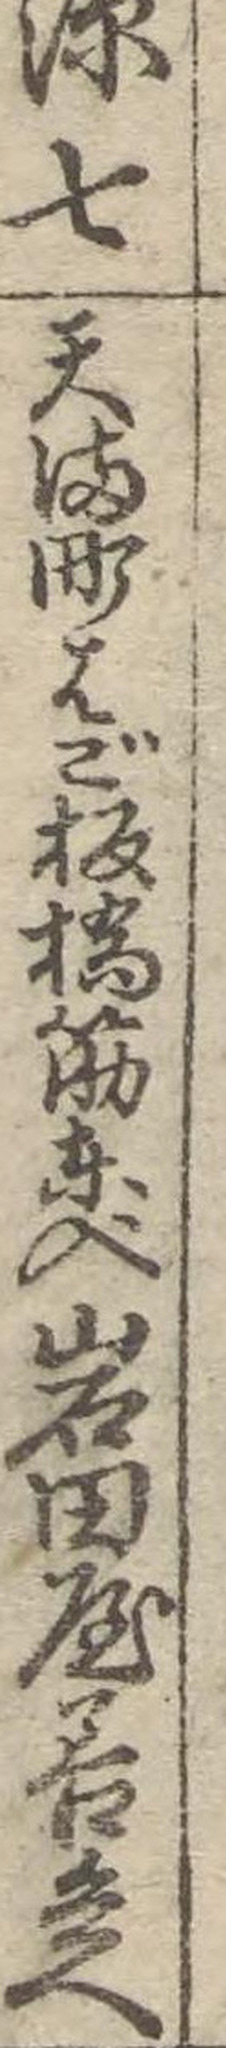天満町はご板橋筋東へ入岩田屋善兵へ
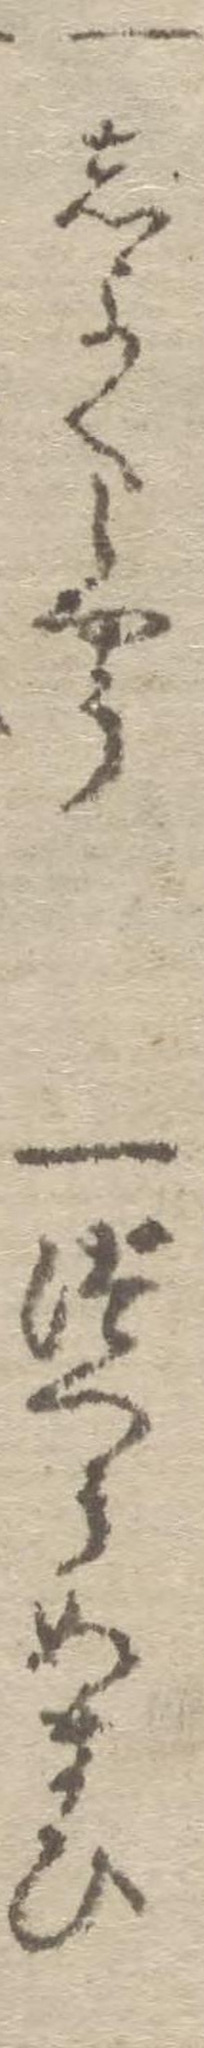一しよくしやう一づつうめまひ
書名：浪華薬種問屋能書張交帖. 二
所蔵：国立国会図書館 National Diet Library, JAPAN
